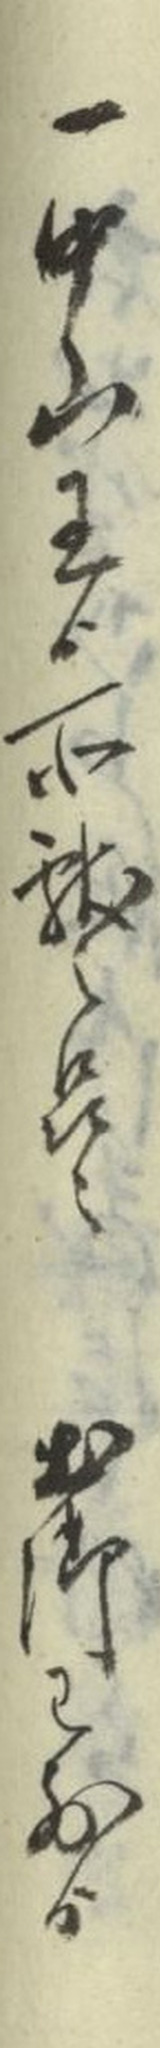一中山王ゟ所献之品々出御已前ゟ
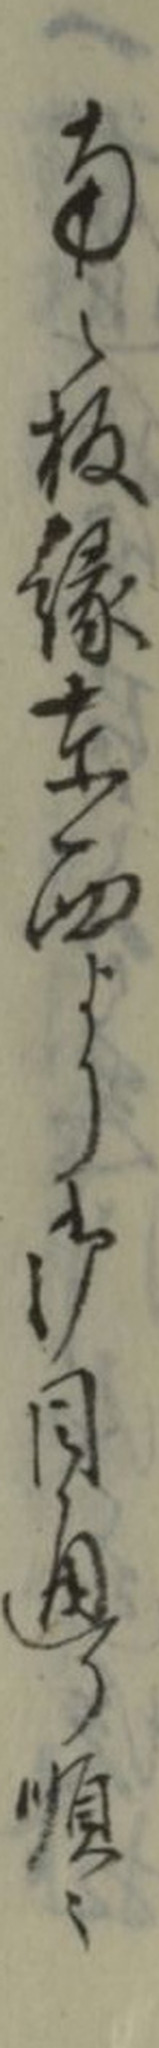南之板縁東西より御目通り順々
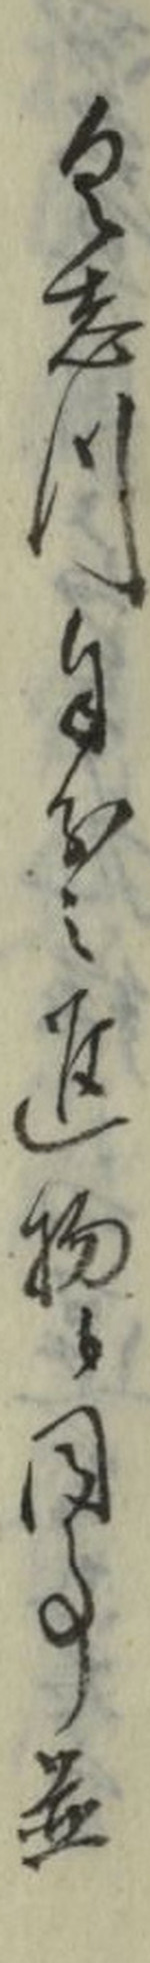具志川自分之進物も同事並
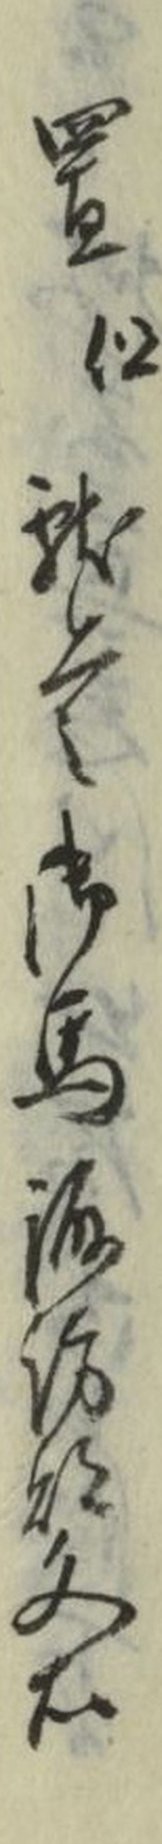置但献上之御馬諏訪部文右
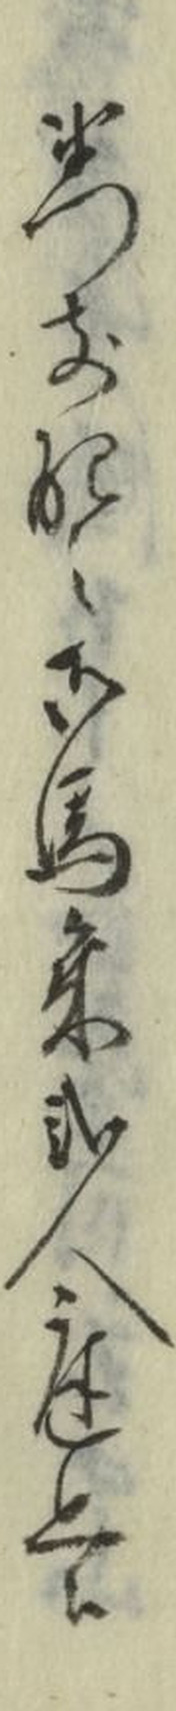衛門支配之御馬乗弐人庭上え
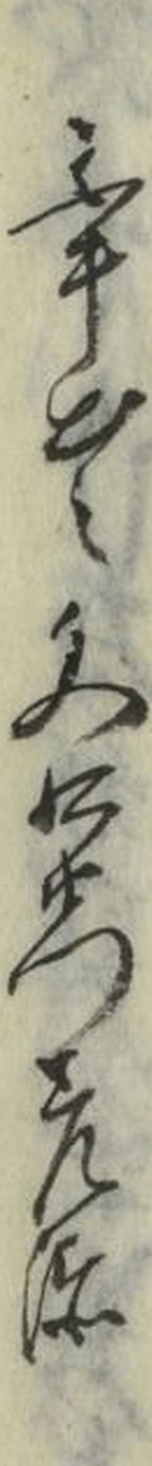牽出之文右衛門差添

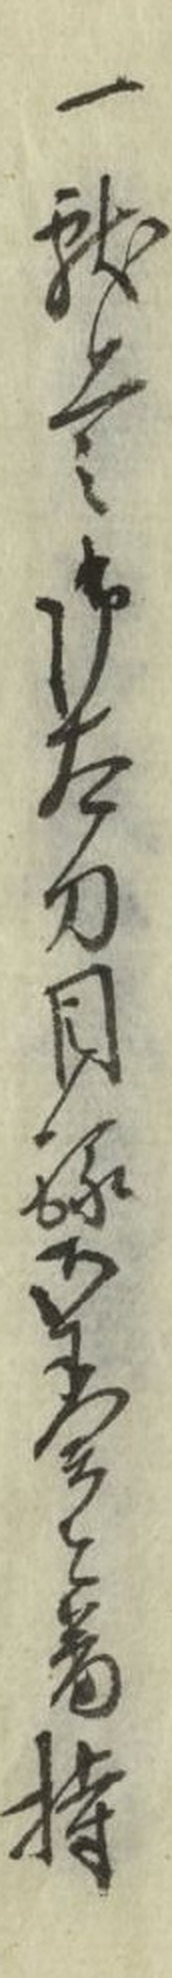一献上之御太刀目録御奏者番持
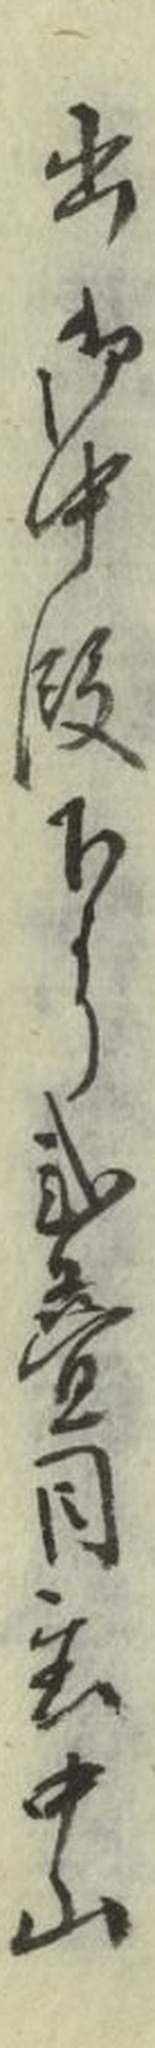出御中段下より弐畳目置中山
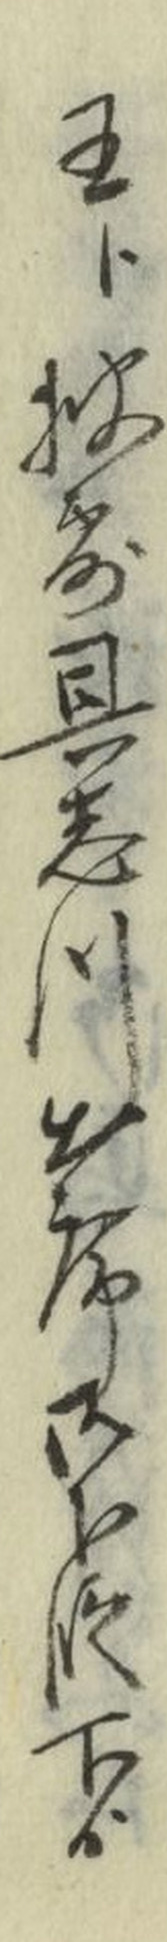王被披露具志川出席御下段下ゟ
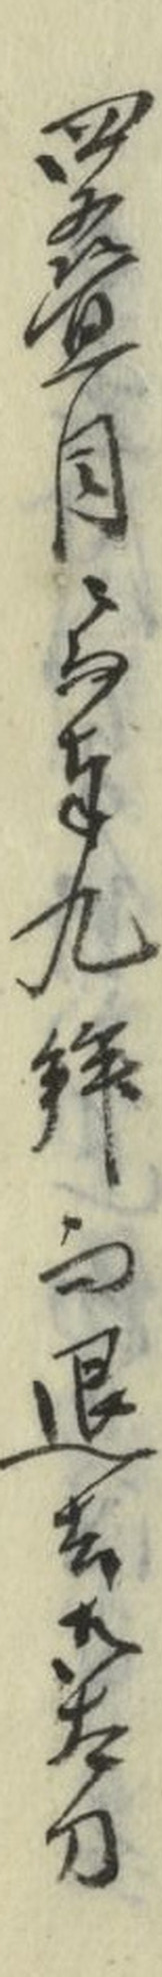四畳目に而奉九拝而退去御太刀
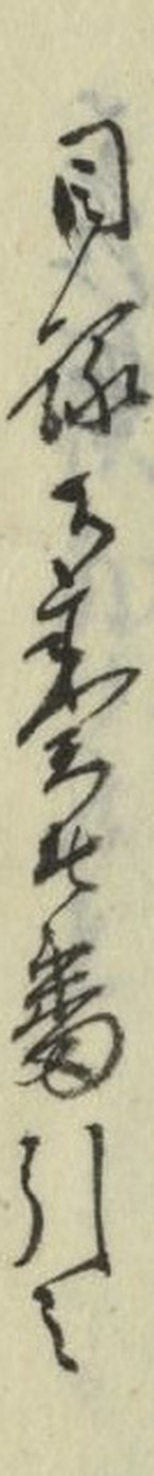目録御奏者番引之
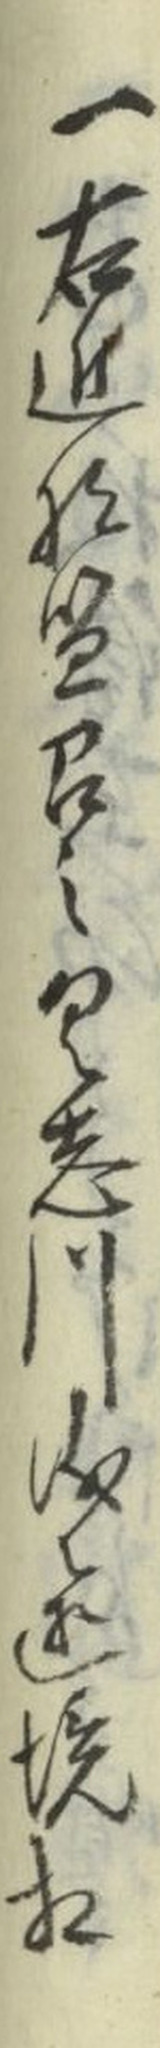一右近将監召之具志川儀遠境相
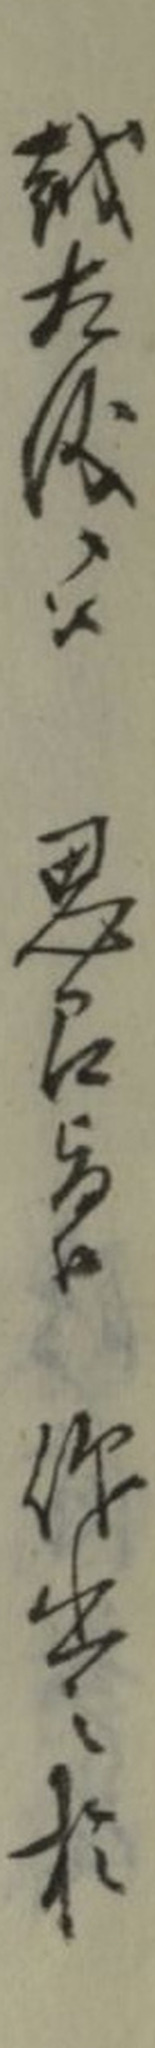越太儀に被思召旨被仰出之於
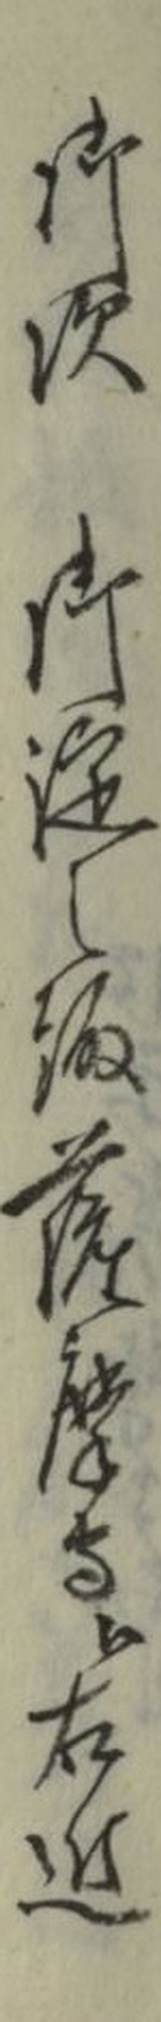御次御諚之趣薩摩守え右近
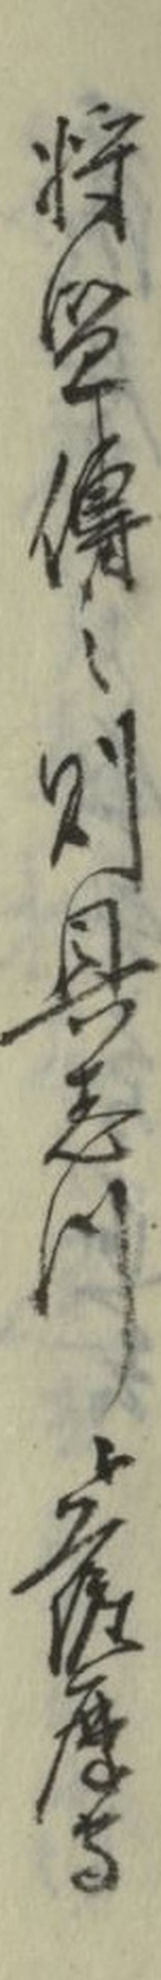将監伝之則具志川え薩摩守
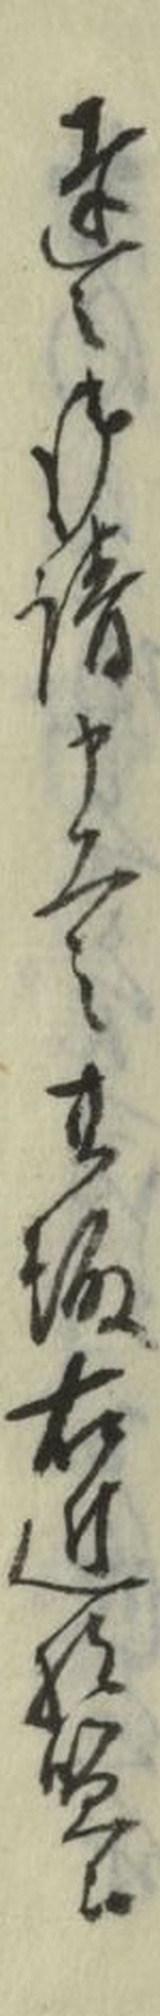達之御請申上之其趣右近将監え
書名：琉球人来朝記 一之二
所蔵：University of the Ryukyus Library
